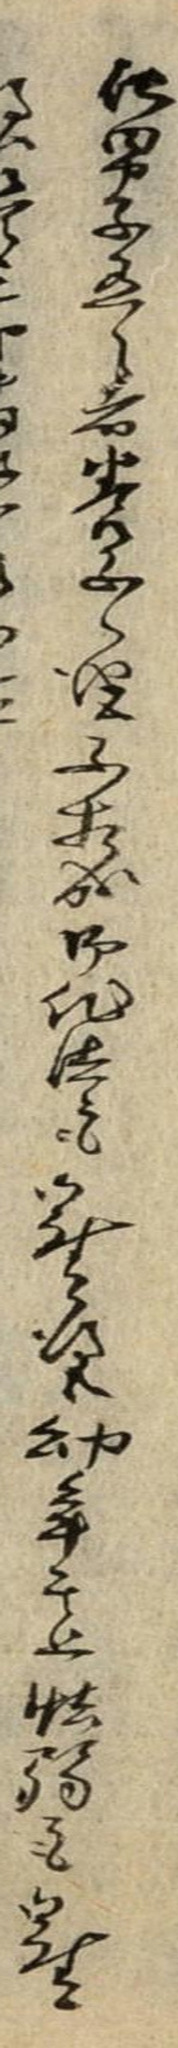但男子有之者養子之儀ハ不相成御作法ニも御座候得共幼年其上怯弱ニも御座候
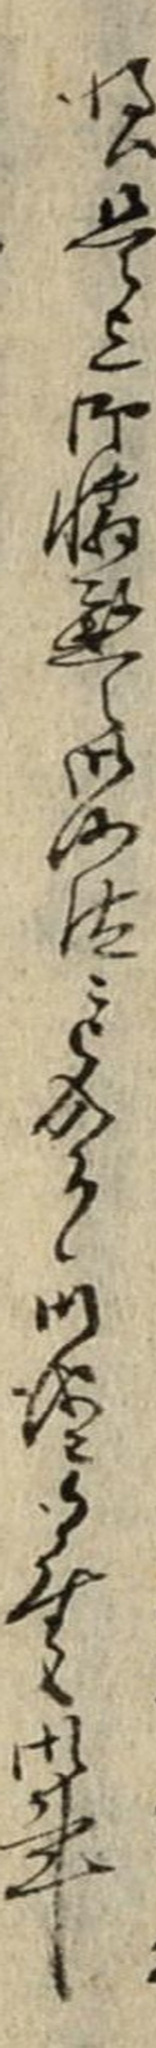得ハ是迄御憐愍之御沙汰ニ被成下候御儀ニ御座候御事
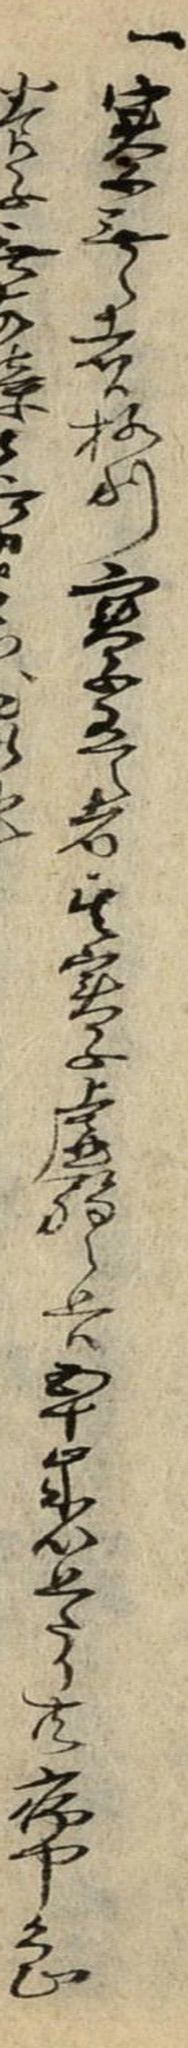一実子無之者ハ格別実子有之者其実子虚弱之者ハ五十歳以上たり共病中急
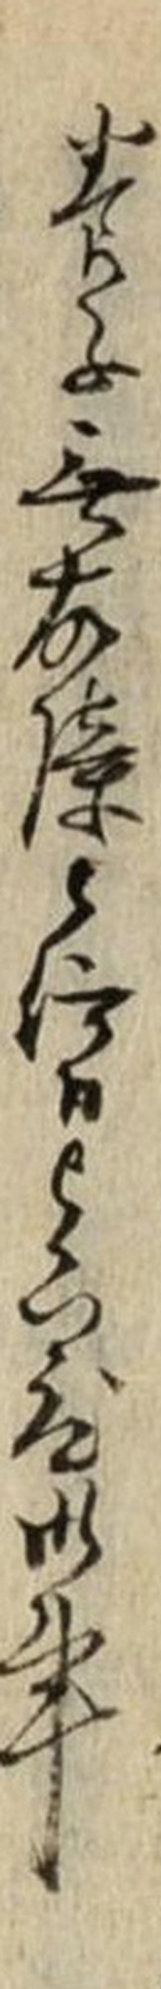養子無故障被仰付被下度御事
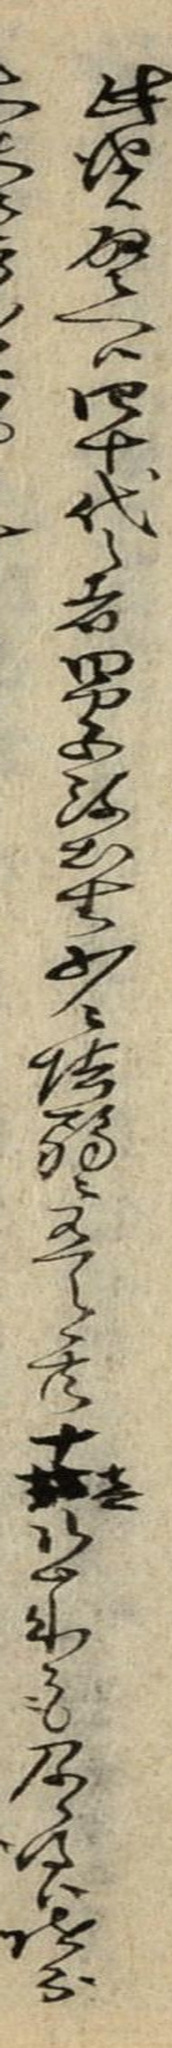此儀ハ譬へハ四十代の者男子致出生少々怯弱ニ有之候共十壱弐歳ニも及候得ハ随分
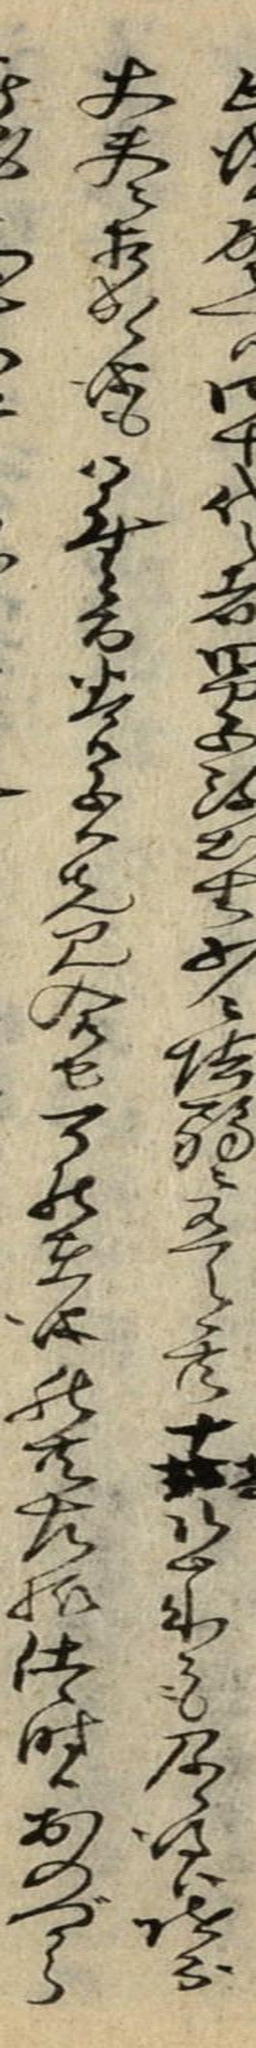丈夫ニ相成候儀も御座候間養子ハ先見合セ可罷在候儀然共左様仕候時ハおのづから
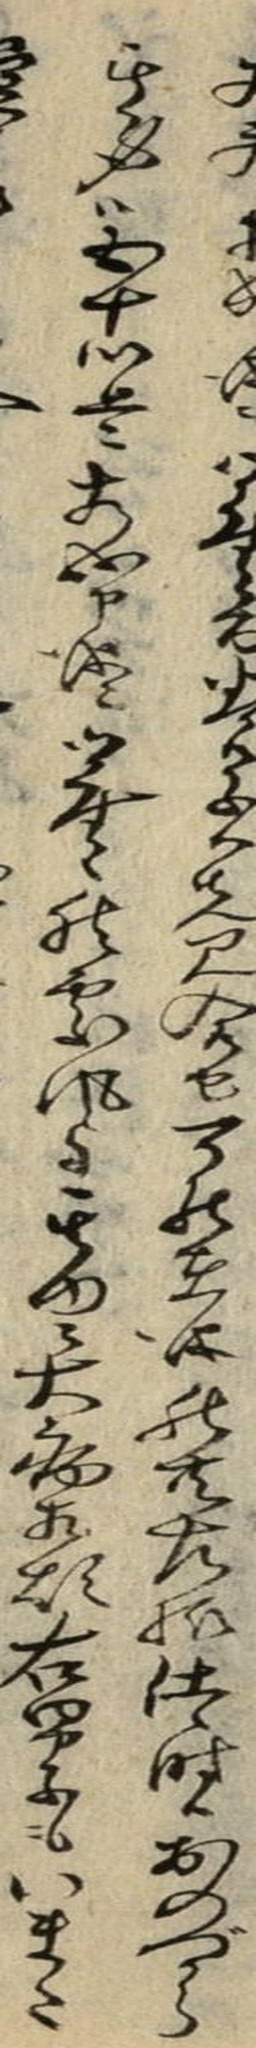其身ハ五十以上ニ相成申儀ニ御座候然処風与其内ニ大病相煩右男子もいまた
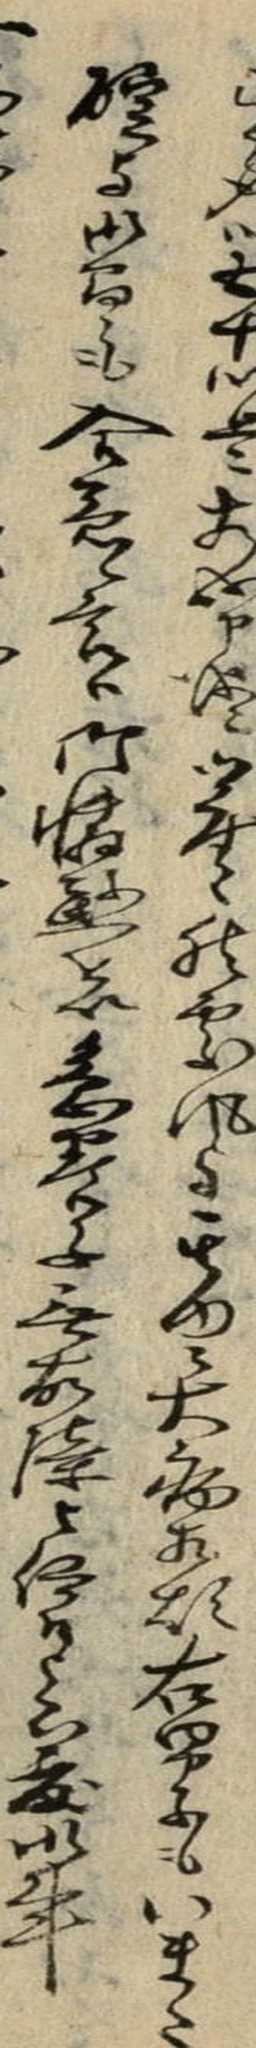聢与御間ニも合兼候節ハ御憐愍を以急養子無故障被仰付被下度御事
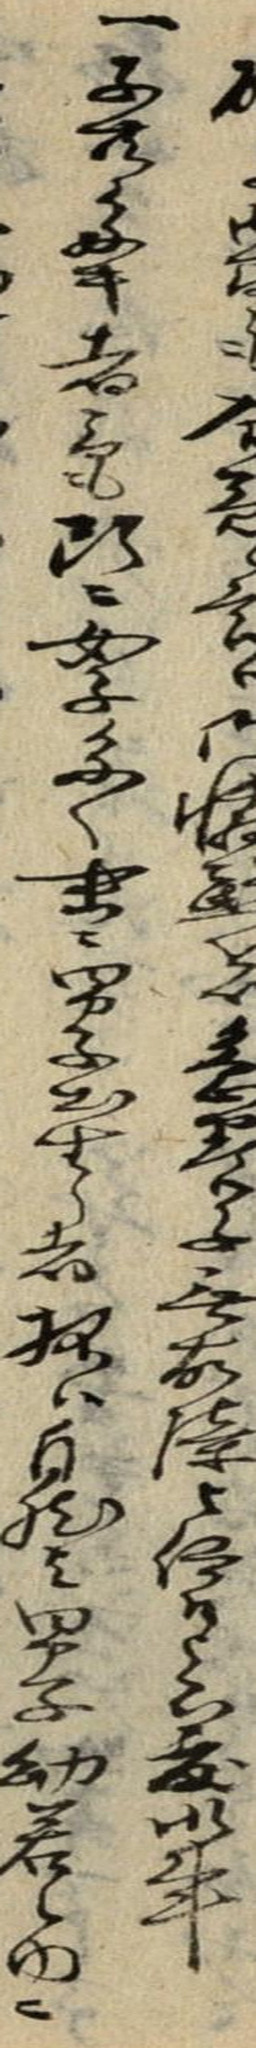一子共多キ者ニ而も既女子多く末ニ男子出生之者抔ハ自然与男子幼若之内ニ
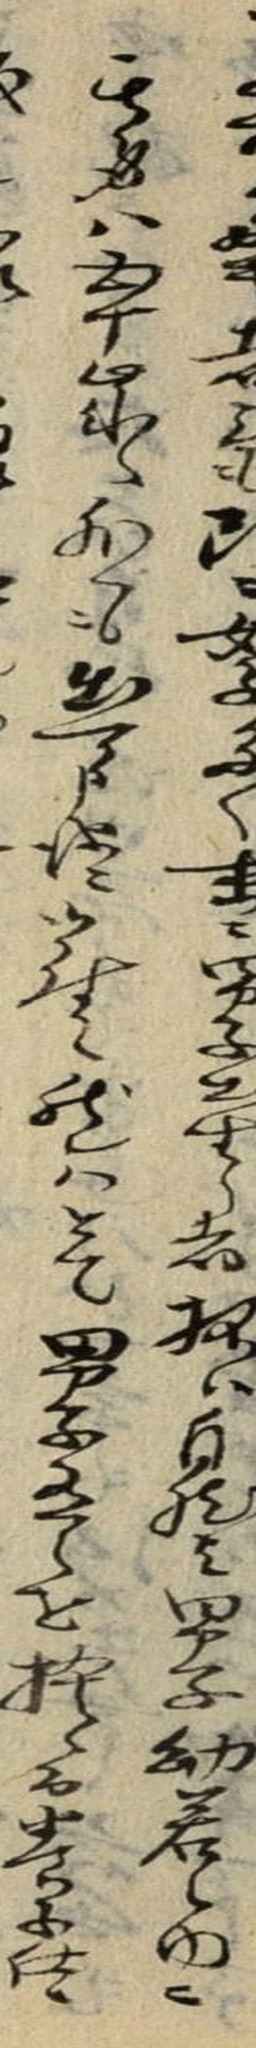其身ハ五十歳之外へも出可申儀ニ御座候然レハとて男子有之を捨候而養子仕候
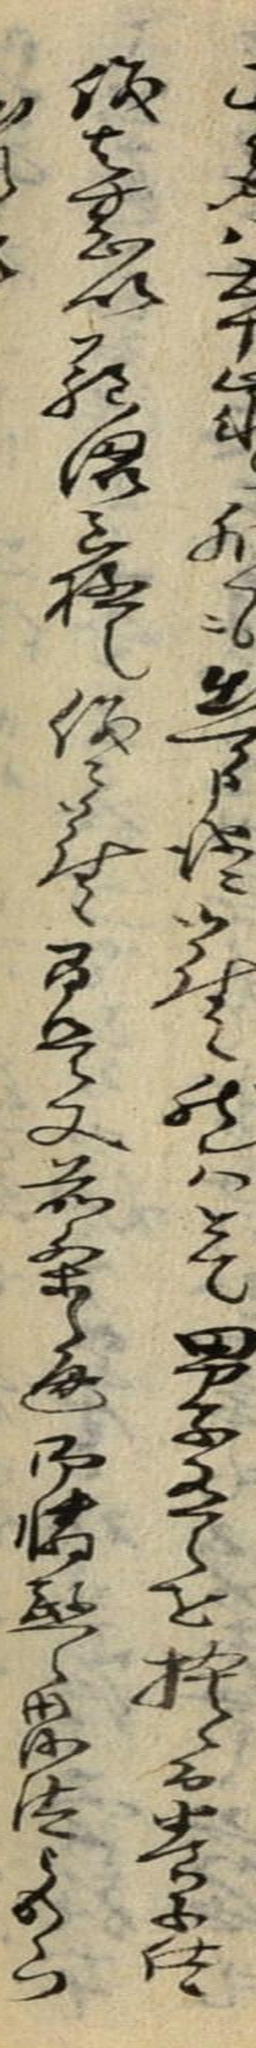儀者甚以難渋至極之儀ニ御座候間是又前条之通御憐愍之御沙汰被成下
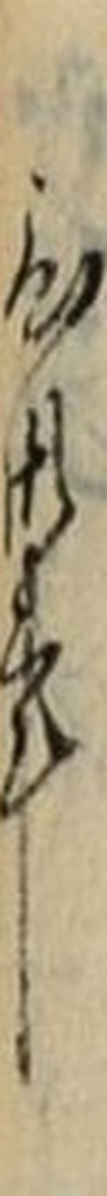度御事
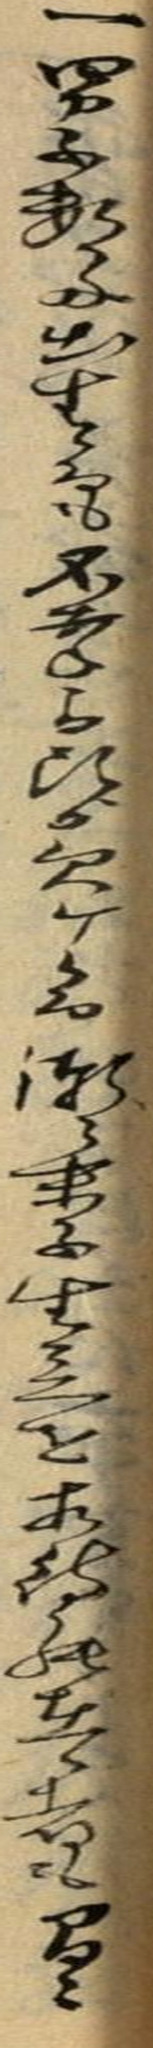一男子数多出生候而も不幸ニ而頭ゟ欠候而漸々末子生立を相待罷在候者も間々
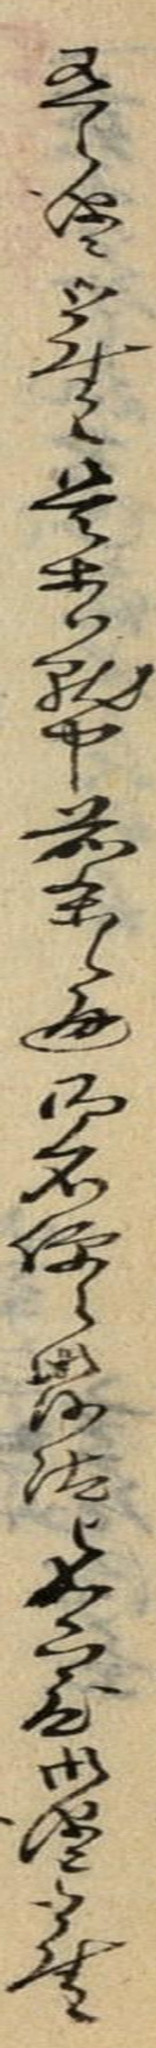有之候儀ニ御座候是等ハ就中前条之通御不便之御沙汰被成下度御儀ニ御座候
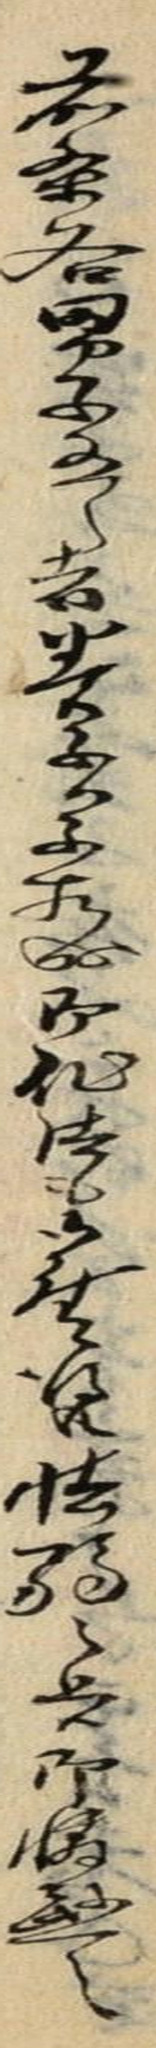前条各男子有之者養子ハ不相成御作法も御座候得共怯弱之上ハ御憐愍之
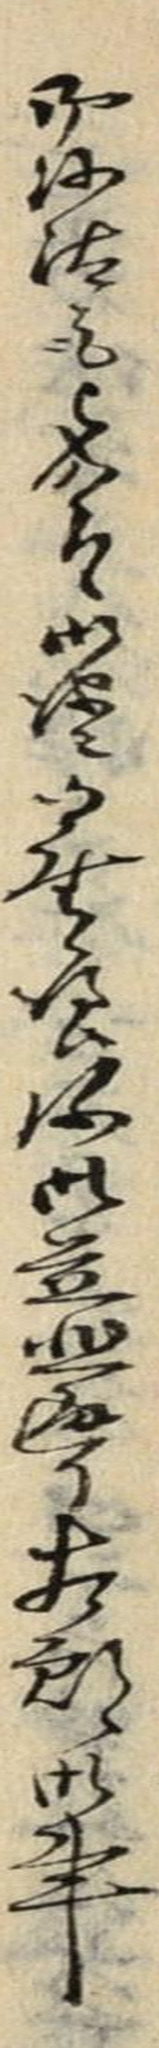御沙汰ニも被成下候御儀ニ御座候得ハ弥御慈悲通り相願候御事
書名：養子縁組之部
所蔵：福井県文書館 Fukui Prefectural Archives
